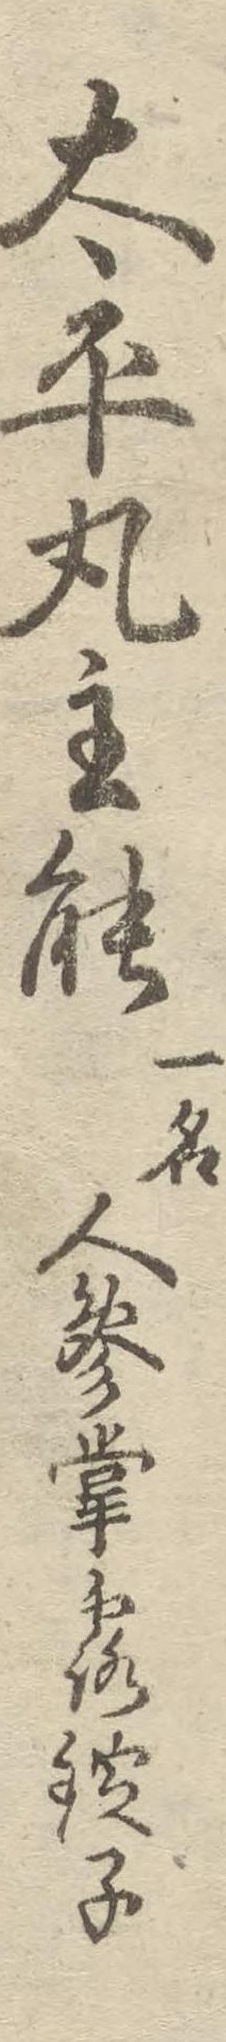太平丸主能一名人参掌露錠子
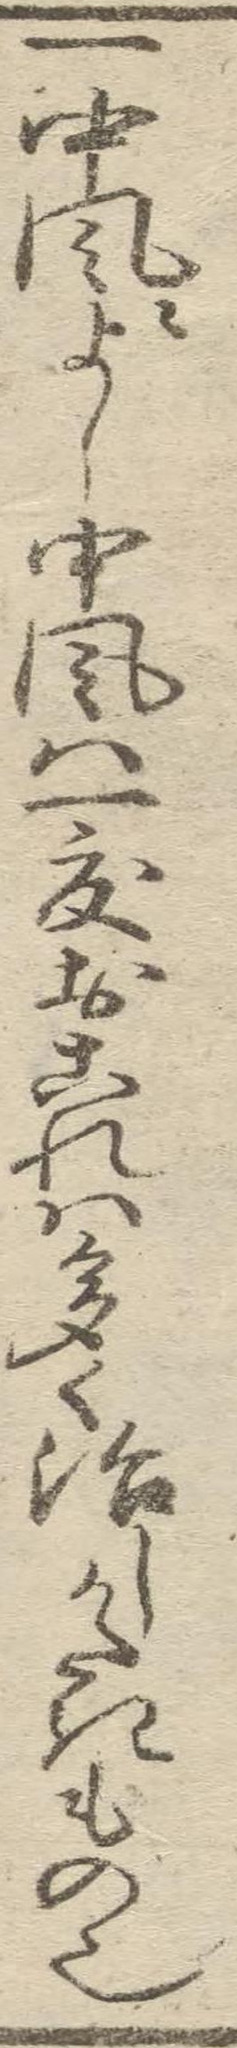一中風ニよし中風は一度おこれは多くな治しかたきもの也
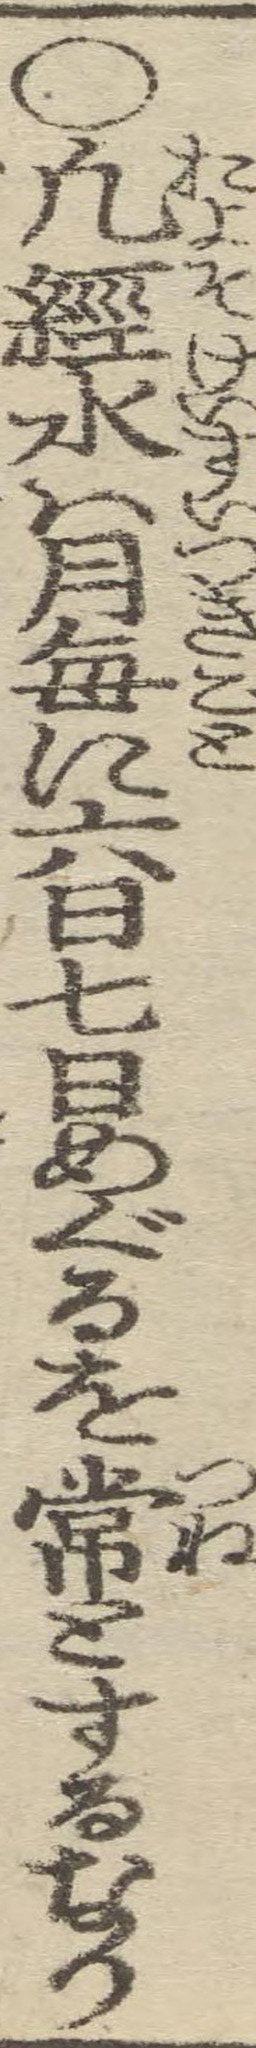○凡経水は月毎六日七日めぐるを常とするなり
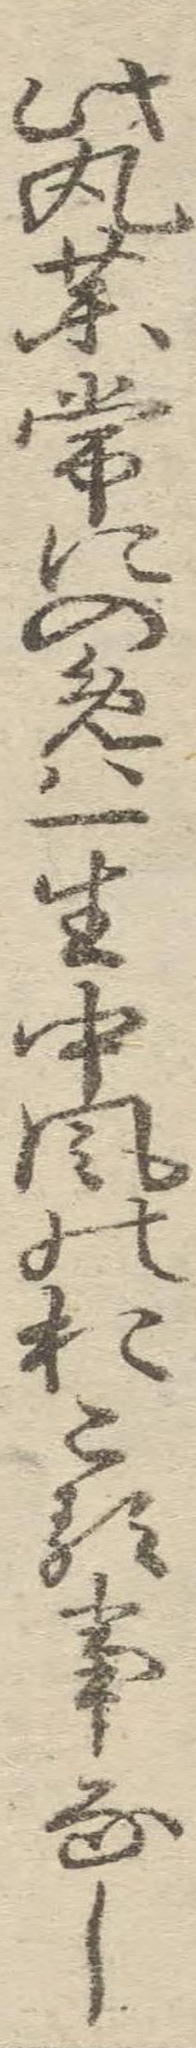此丸薬常にのめは一生中風のおこる事なし
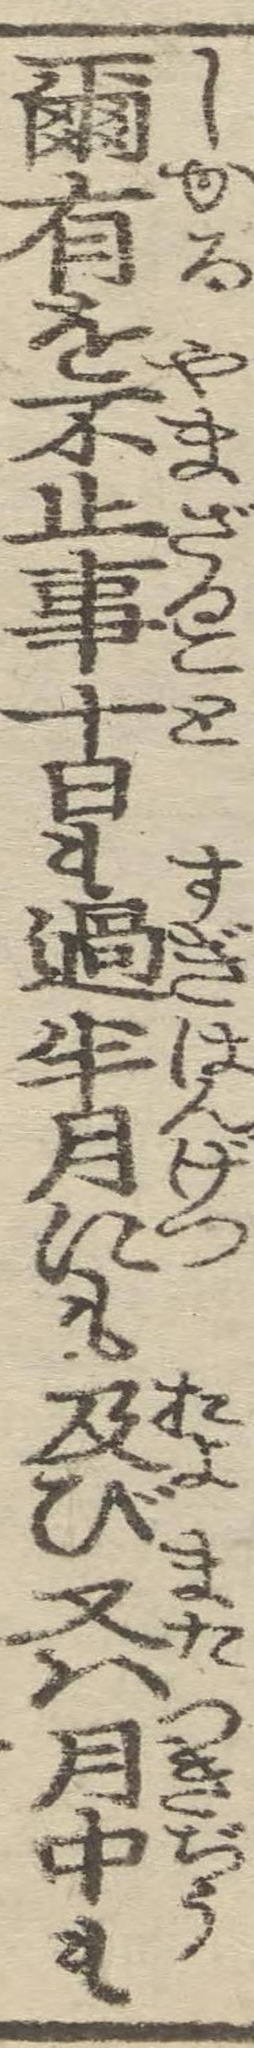爾有を不止事十日も過半月にも及び又は月中も
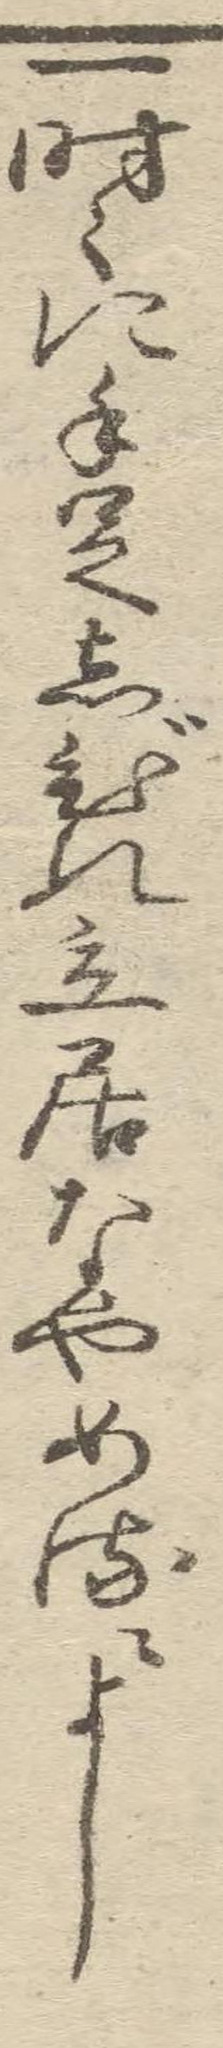一時々に手足しびれ立居なやめるニよし
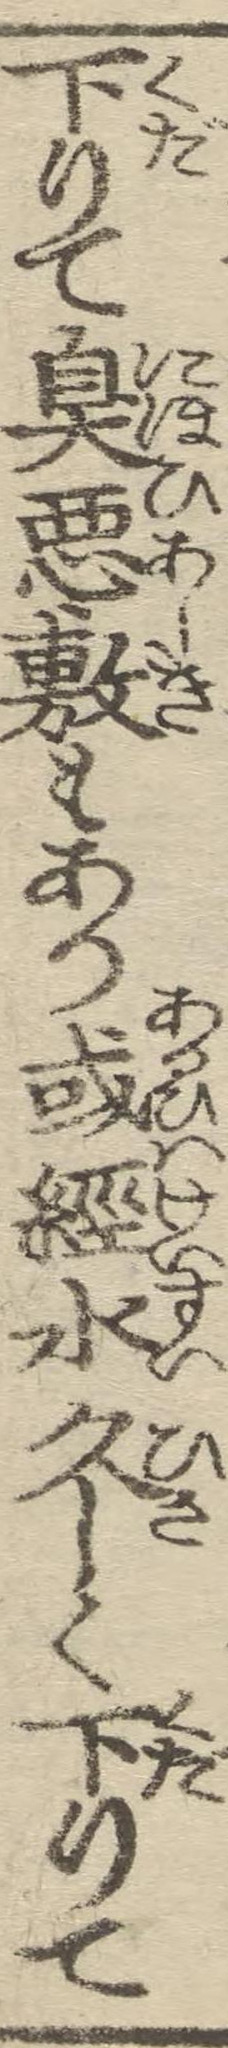下りて臭悪敷もあり或経水久しく下りて
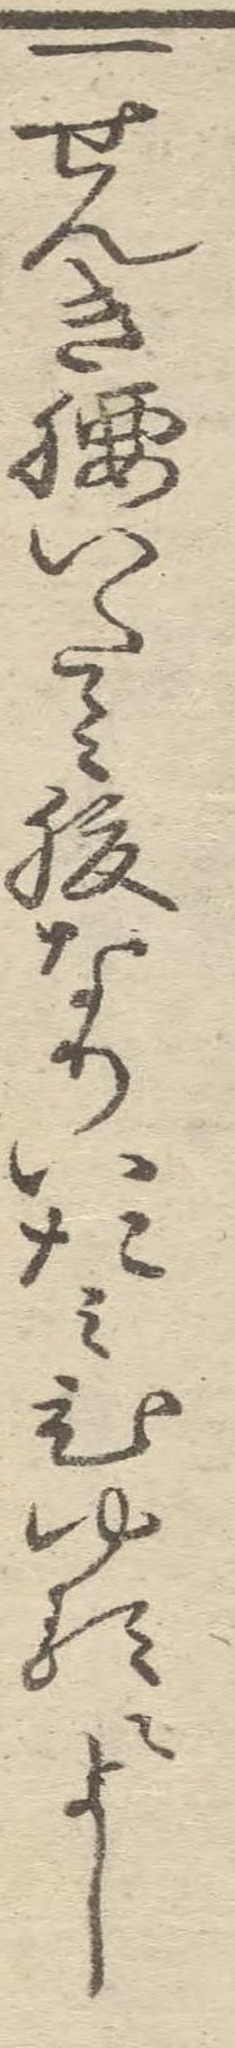一せんき腰いたみ腹なりいたみひゆるニよし
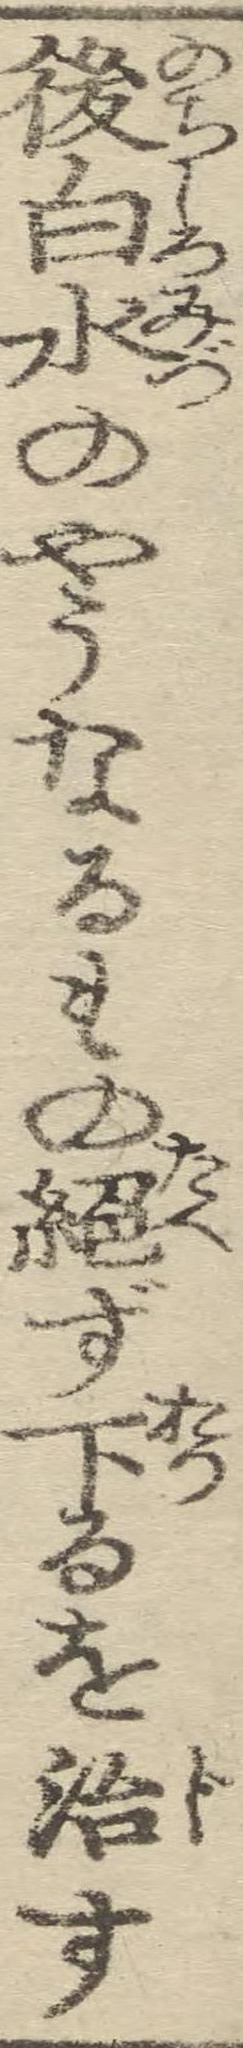後白水のやうなるもの絶ず下るを治す
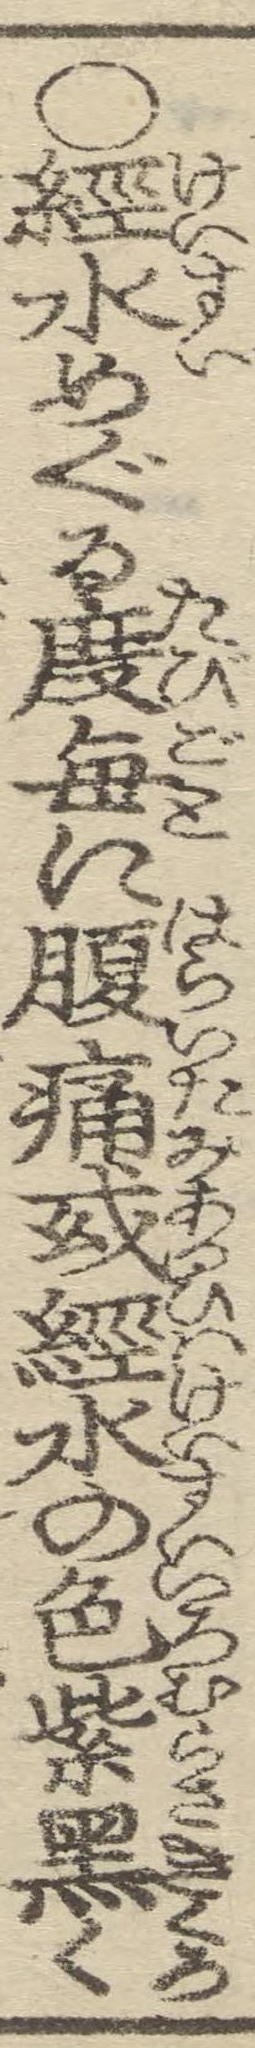○経水めぐる度毎に腹痛或経水の色紫黒く
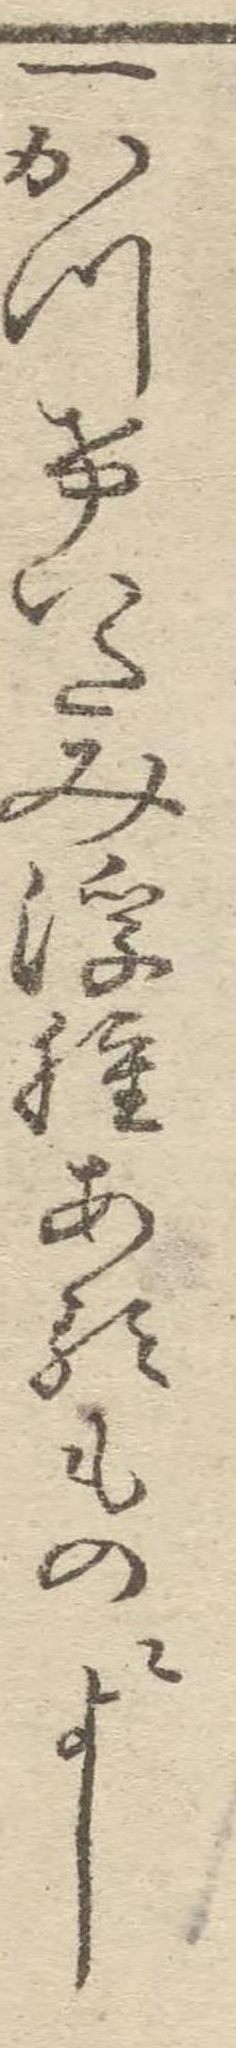一かつけいたみ浮腫あるものニよし
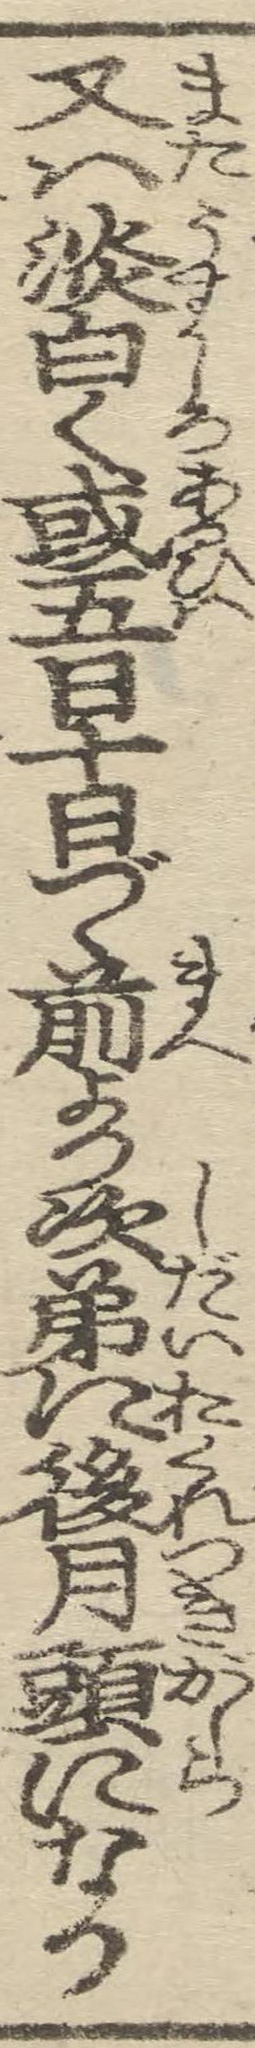又は淡白く或五日十日づゝ前より次第に後月頭になり
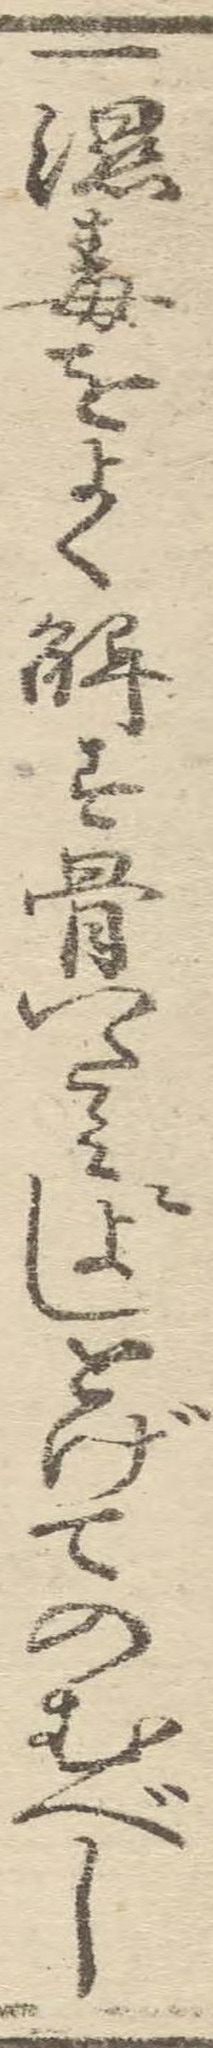一湿毒をよく解す骨いたみニよしとげてのむべし
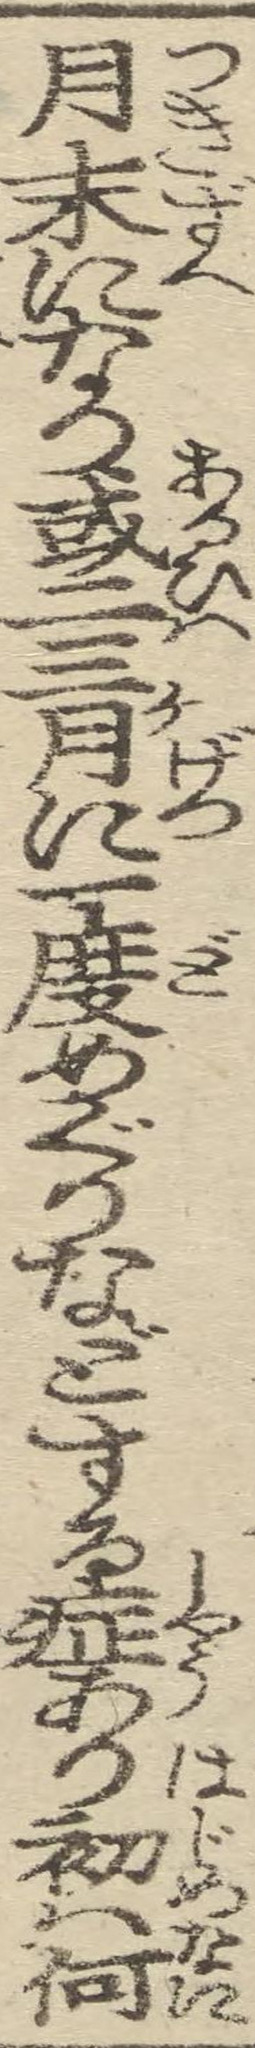月末になり或二三ヶ月に一度めぐりなどする症あり初は何
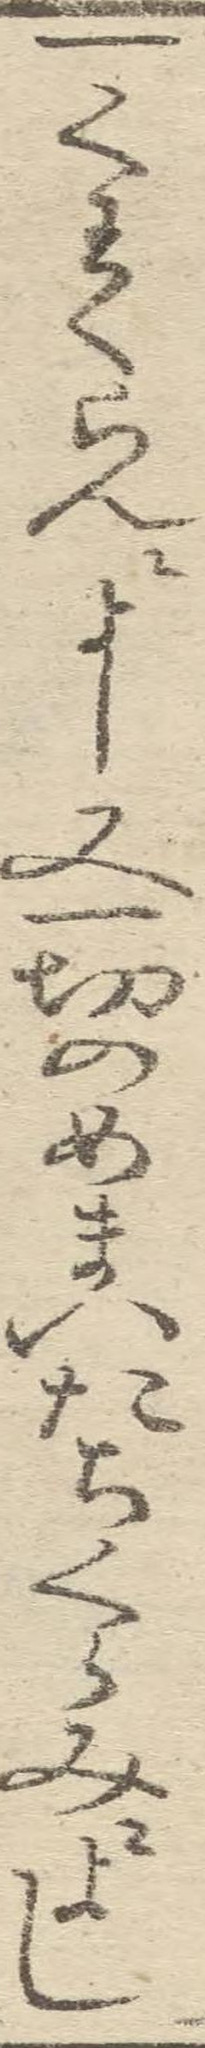一くわくらんニよし又一切のめまいたちくらみニよし
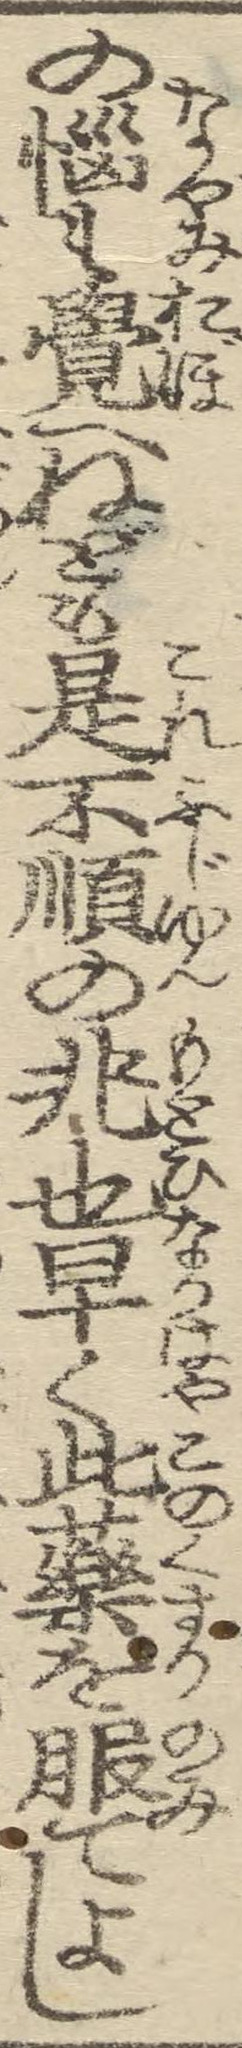の悩も覚へねども是不順の兆也早く此薬を服てよし
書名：浪華薬種問屋能書張交帖. 二
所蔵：国立国会図書館 National Diet Library, JAPAN
